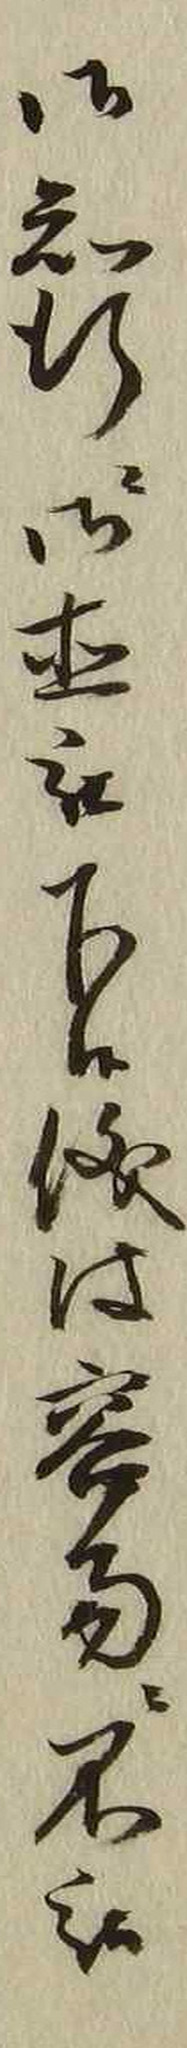御知行ニ御直被下候儀は容易ニ不被
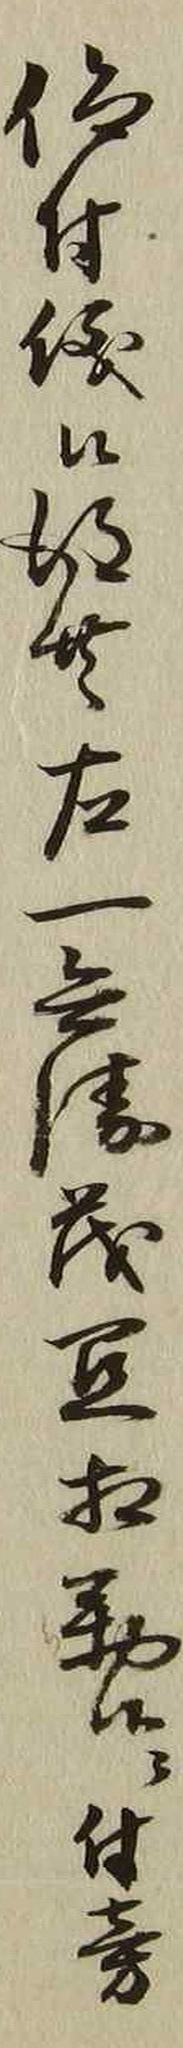仰付儀候得共左一兵衛も宜相勤候ニ付旁
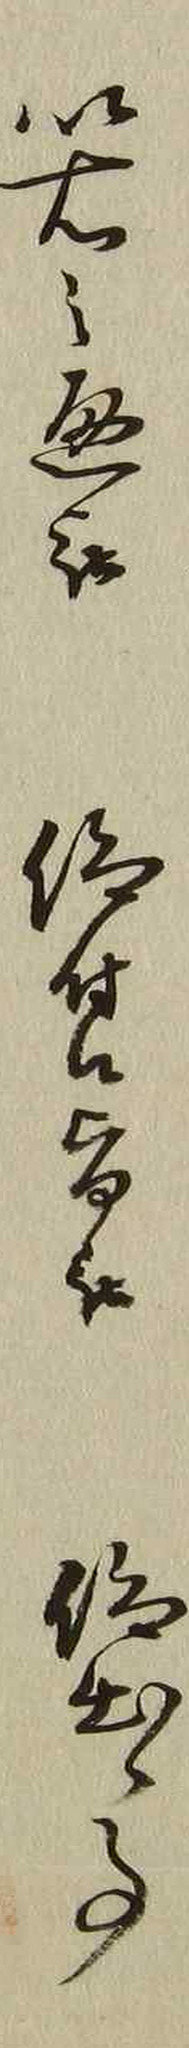以右之通被仰付候旨被仰出候事
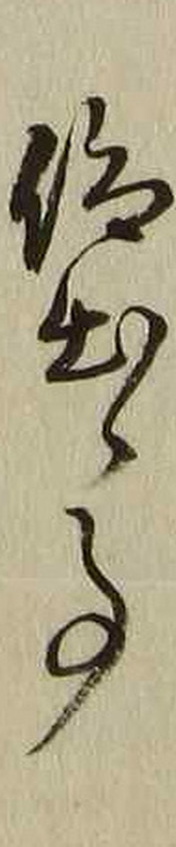仰付候事
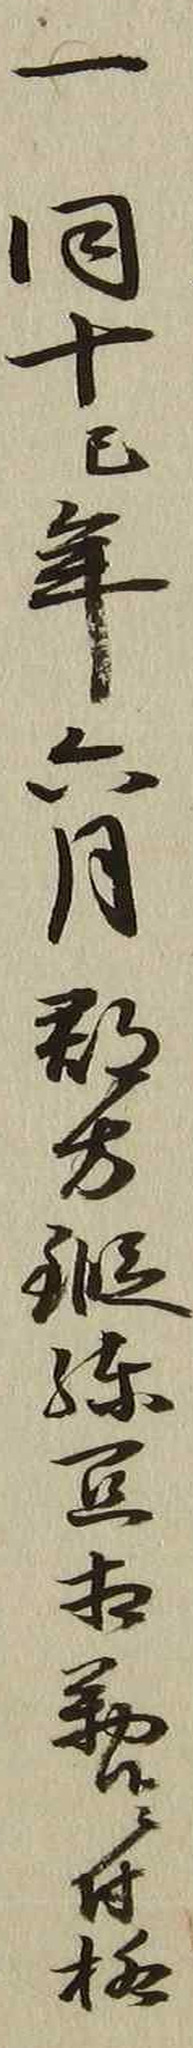一同十巳年六月郡方鍛練宜相勤ニ付格
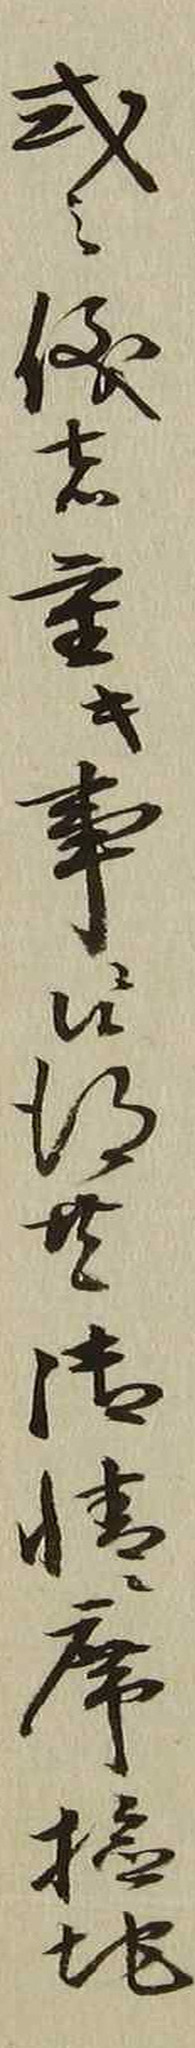式之儀者重キ事ニ候得共御情ニ席検地
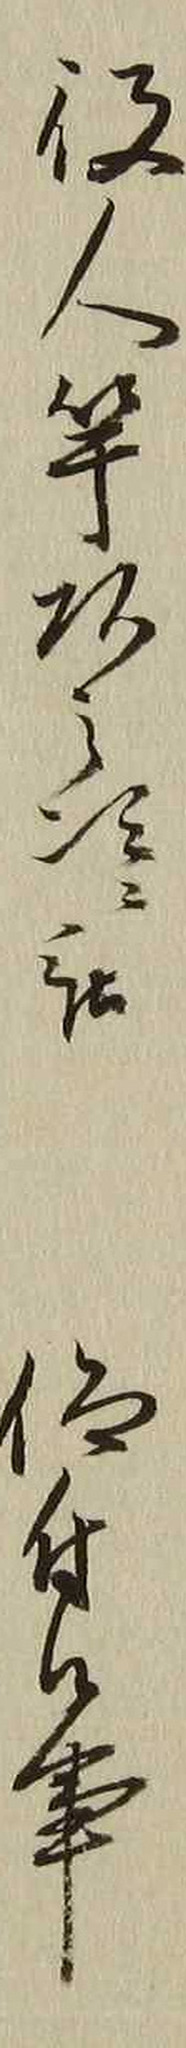役人竿頭之次ニ被仰付候事
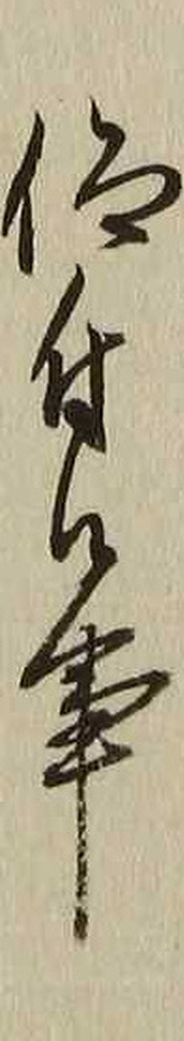仰付候事
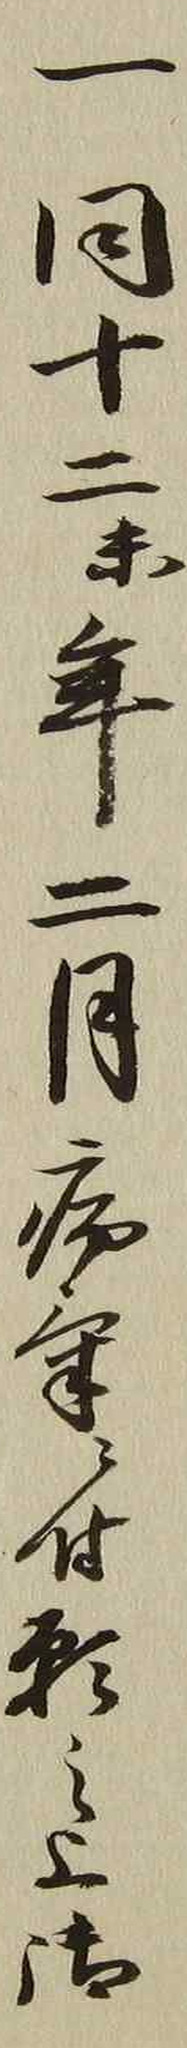一同十二未年二月病気ニ付願之上御
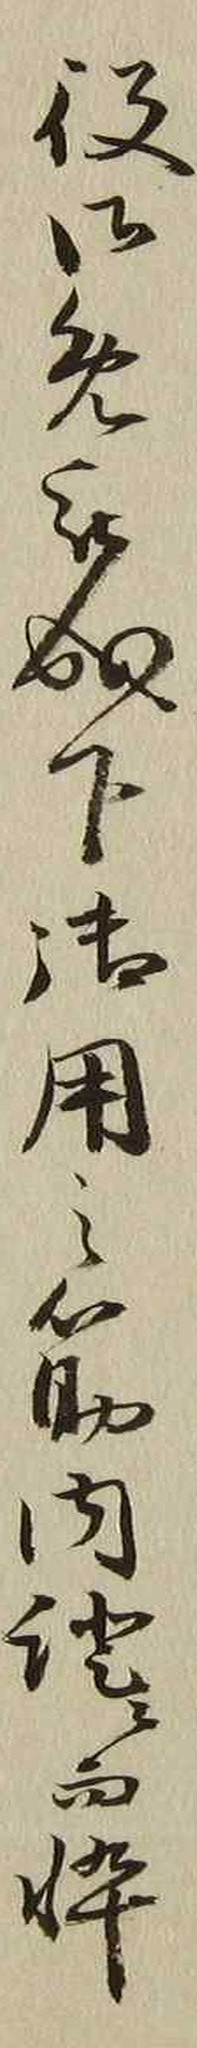役御免被成下御用之筋内証ニ而忰
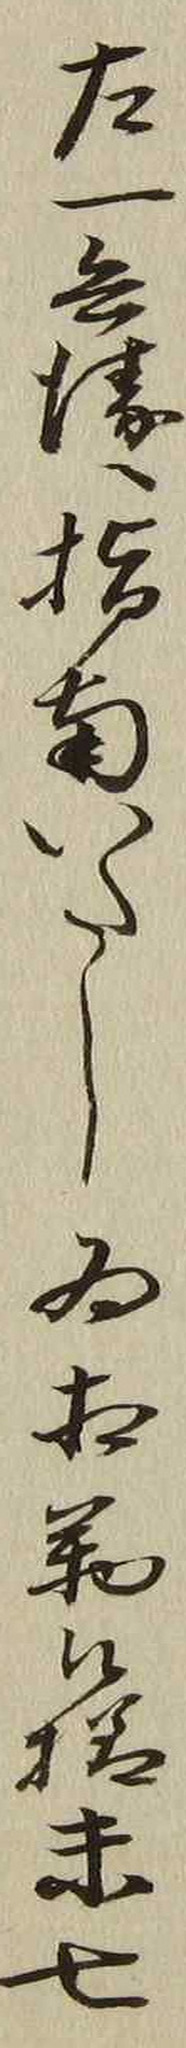左一兵衛へ指南いたし為相勤候様未七
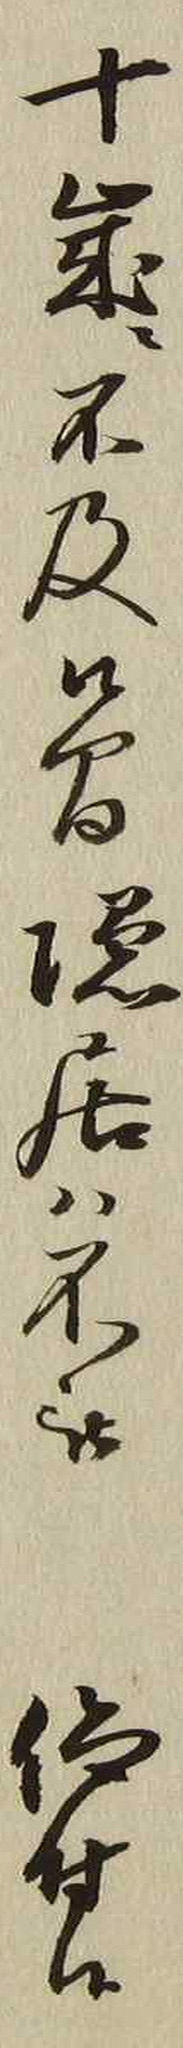十歳ニ不及候間隠居ハ不被仰付候
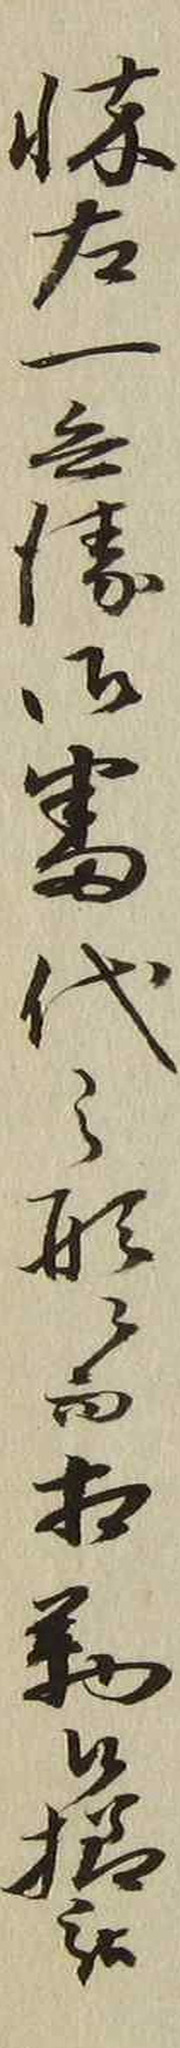忰左一兵衛御番代之形ニ而相勤候様被
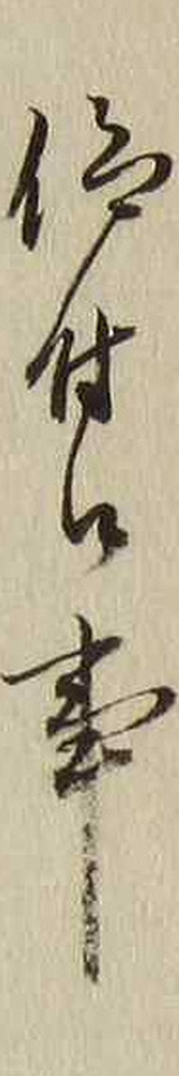仰付候事
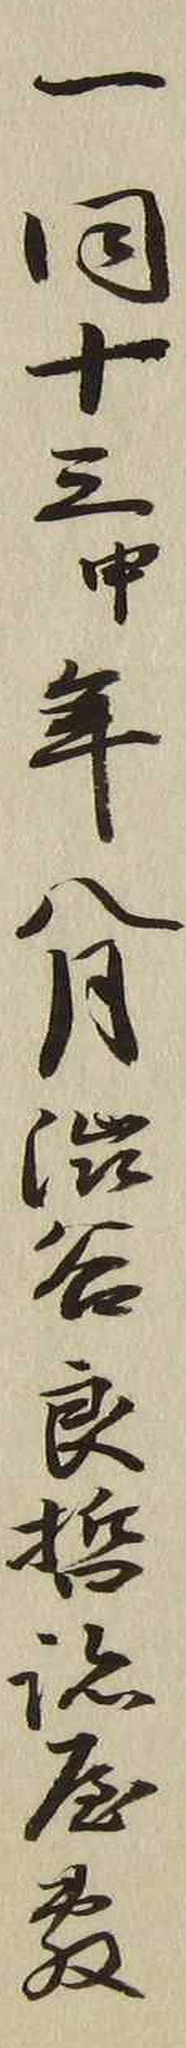一同十三申年八月渋谷良哲跡屋敷
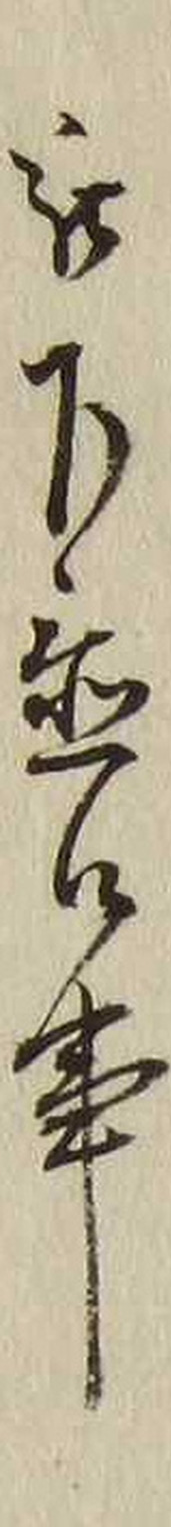被下置候事
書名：諸士系譜　巻之61　と之部4
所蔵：会津若松市立会津図書館
